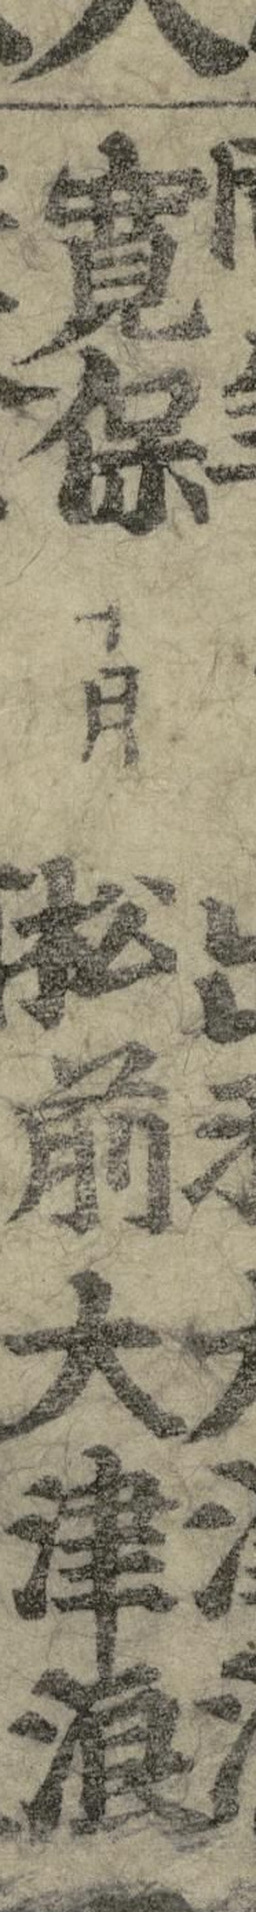寛保十月松前大津浪
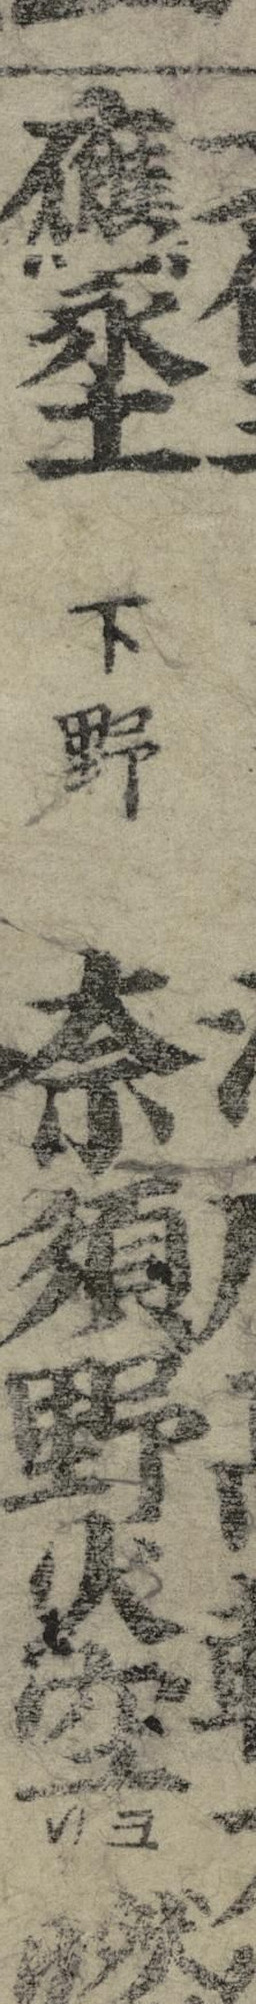応永十一下野奈須野火空ヨリ燃
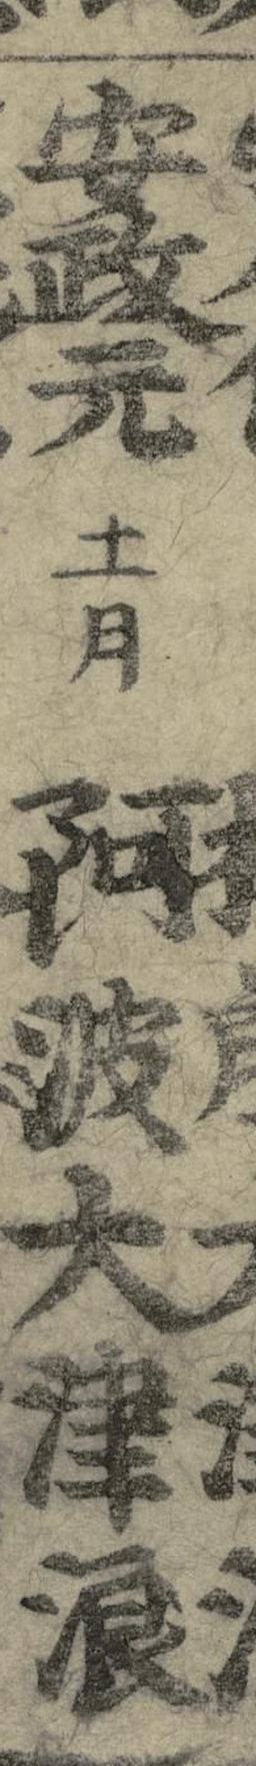安政元十一月阿波大津浪
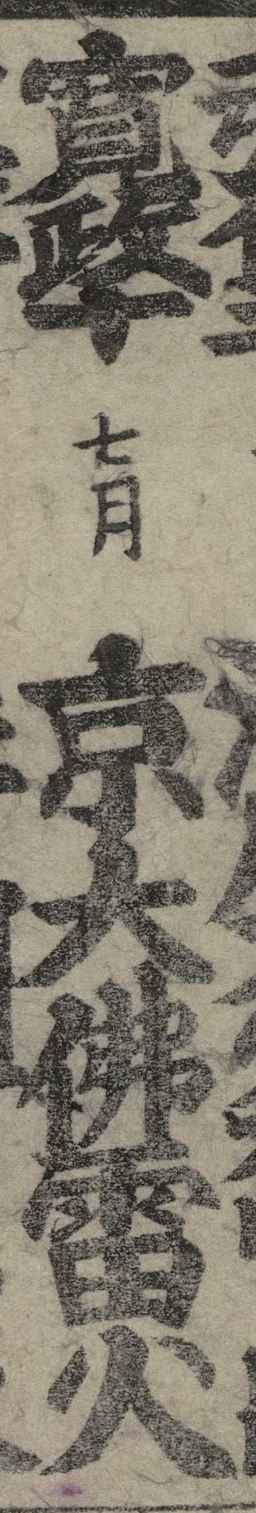寛政十七月京大仏雷火
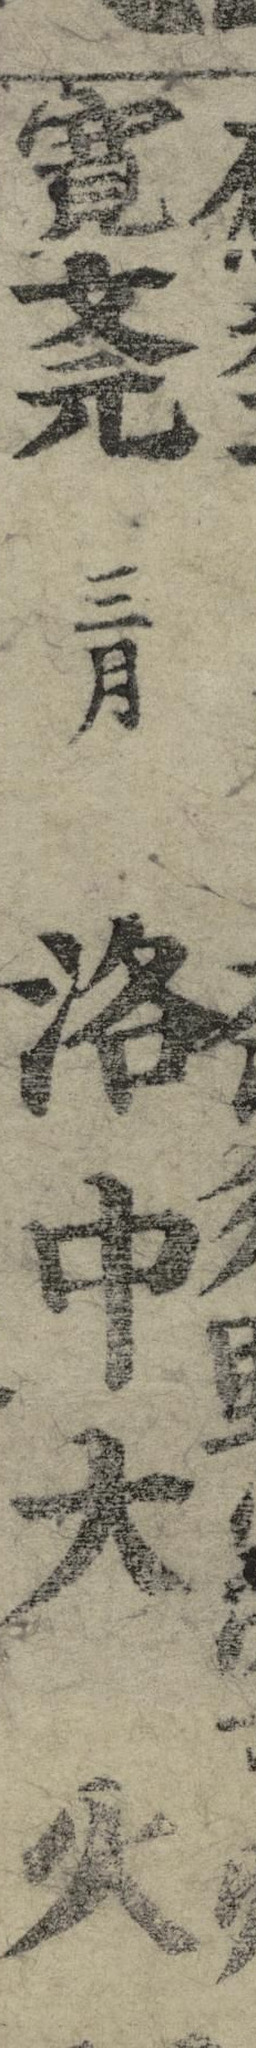寛文元三月洛中大火
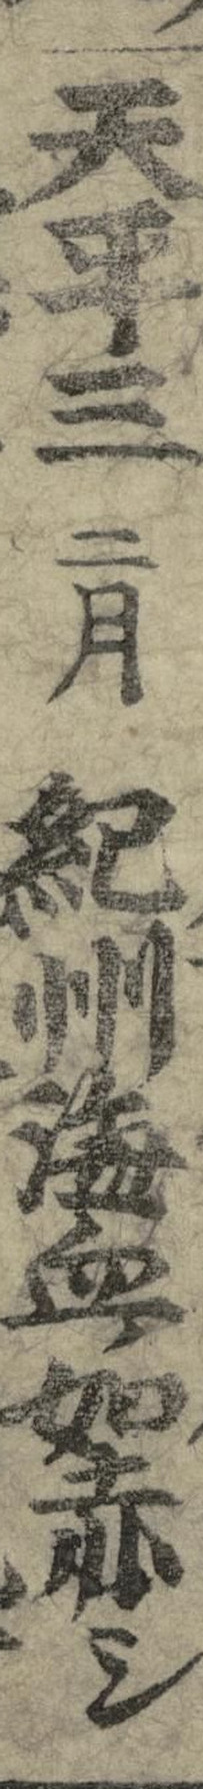天平三二月紀州海血ノ如赤シ
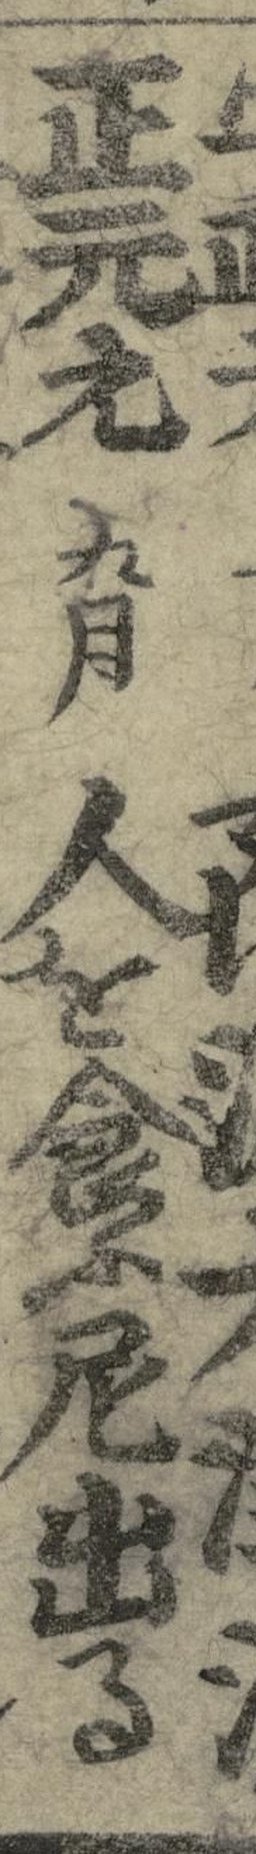正元元九月人を食う尼出る
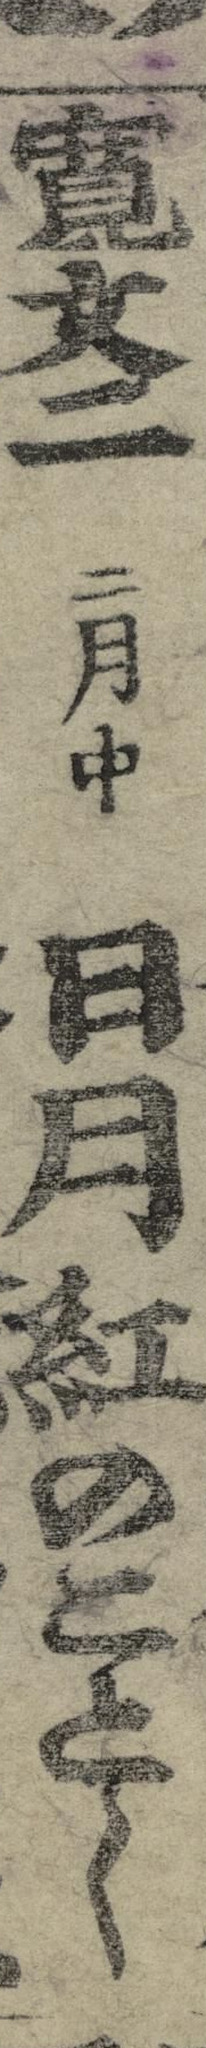寛文二二月中日月紅のことく
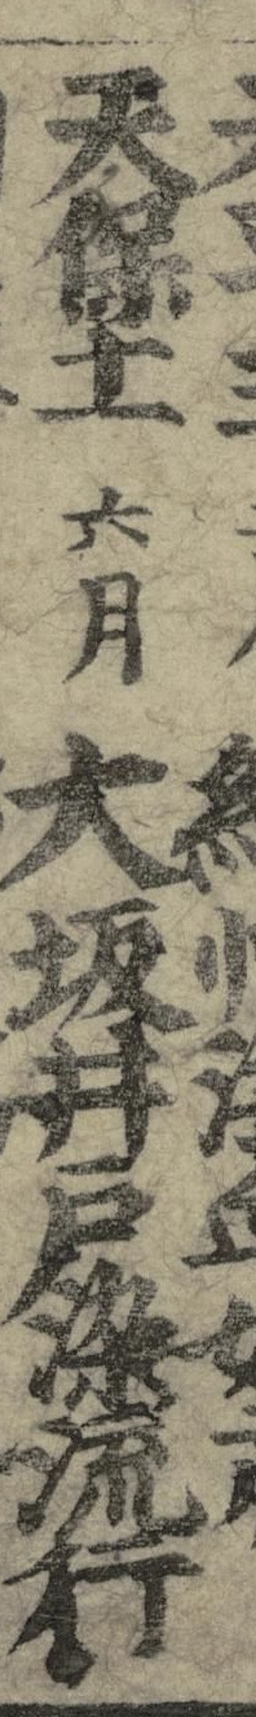天保十一六月大坂井戸染流行
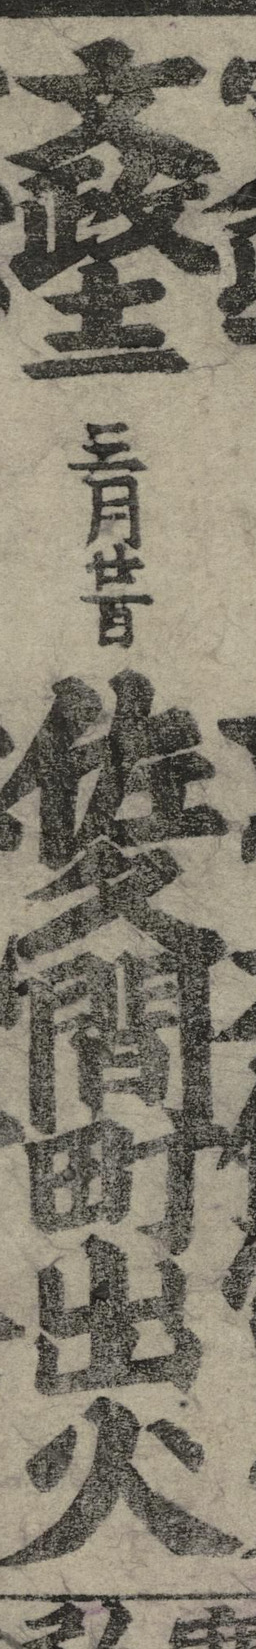文政十二三月廿一日佐久間町出火
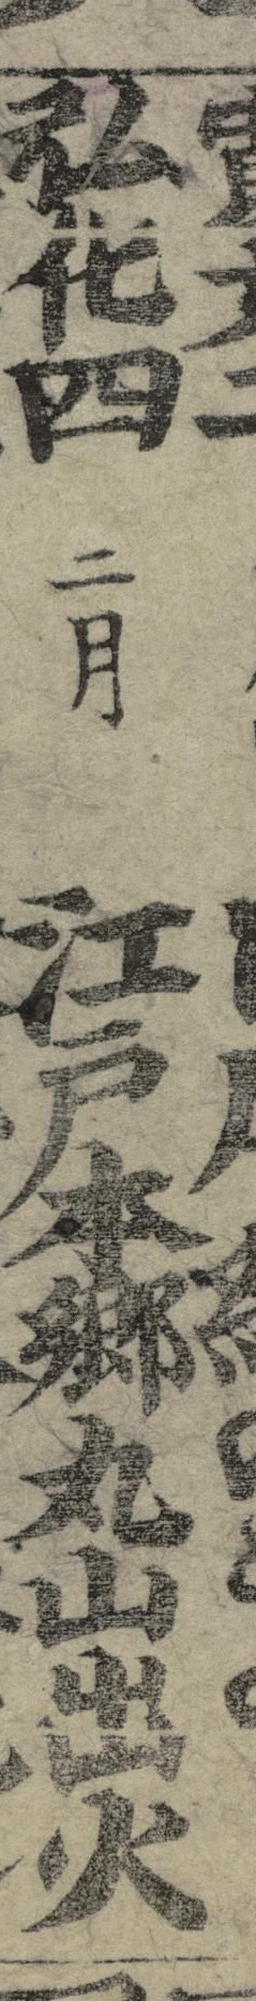弘化四二月江戸本郷丸山出火
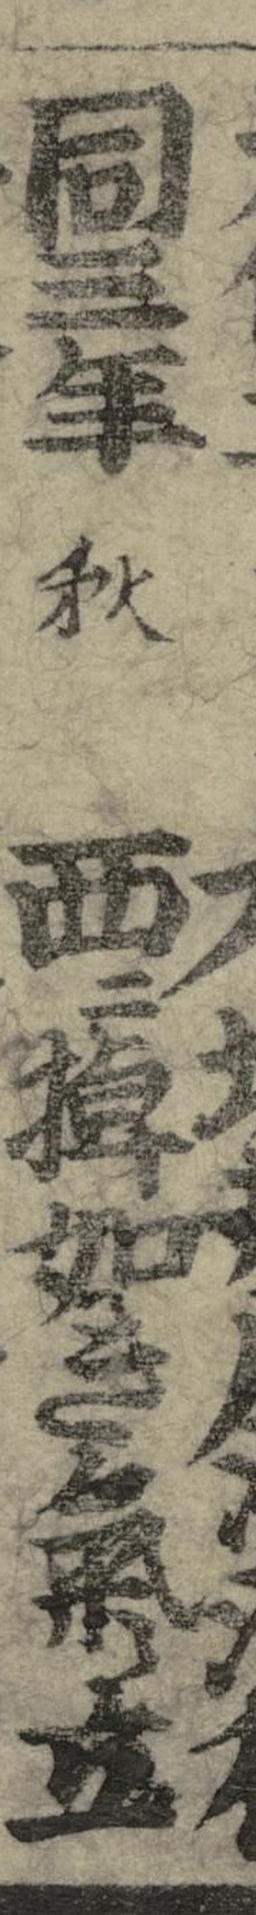同三年秋西ニ棹如き気立
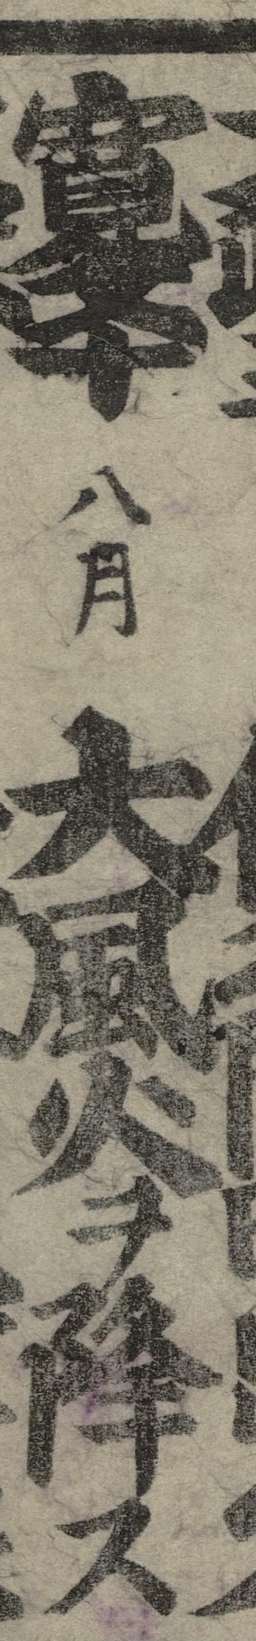寛文十八月大風火ヲ降ス
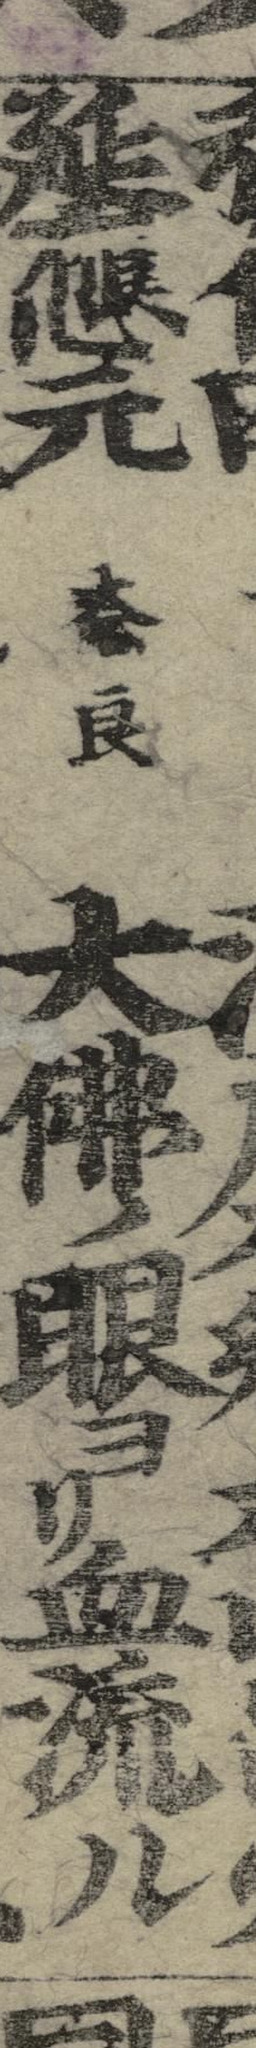延応元奈良大仏ノ眼ヨリ血流ル
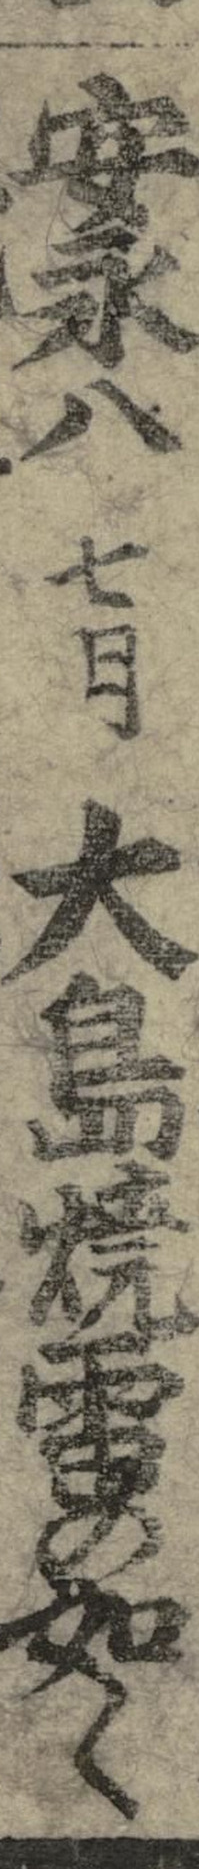安永八七月大島焼雷の如く
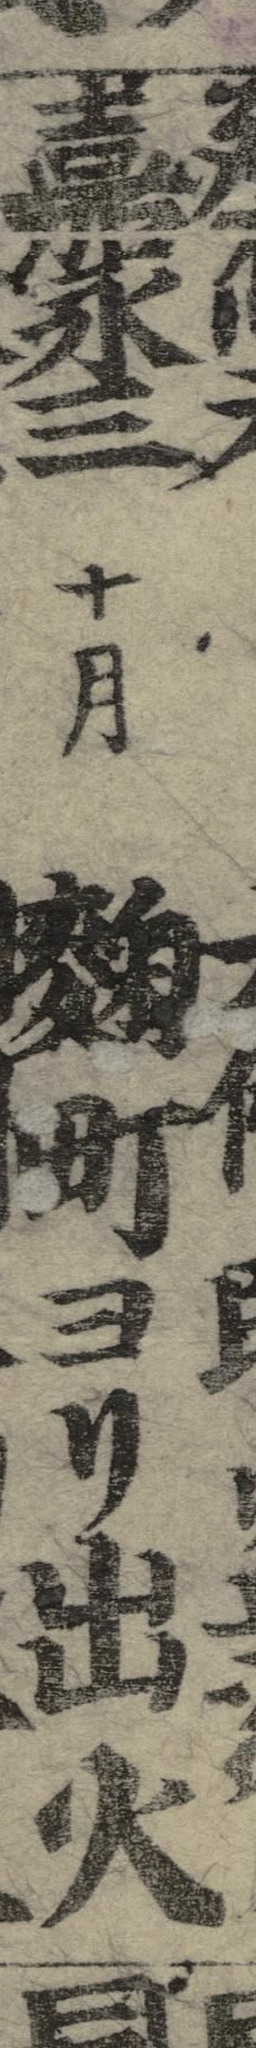嘉永三十月麹町ヨリ出火
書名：珎事一覧
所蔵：東京大学地震研究所図書室 Earthquake Research Institute Library, The University of Tokyo, JAPAN
